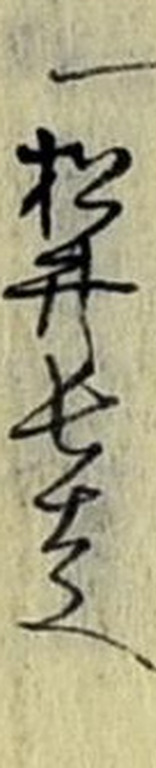松井長太夫
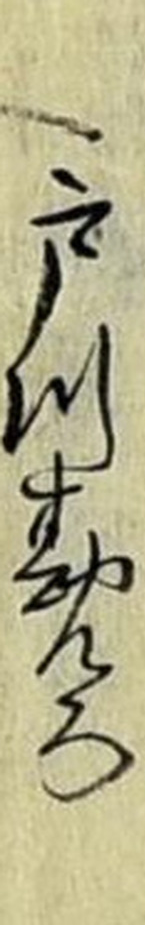戸川勘左衛門
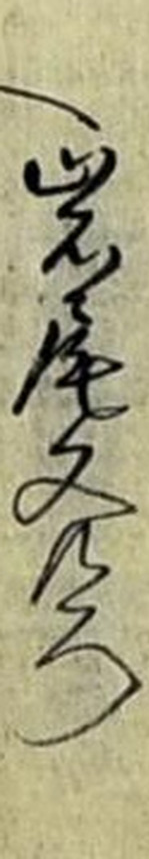岩尾文左衛門
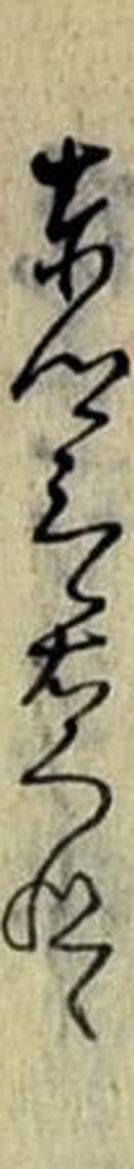東郷三郎右衛門組へ
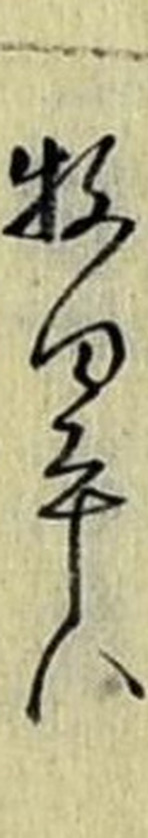牧田平八
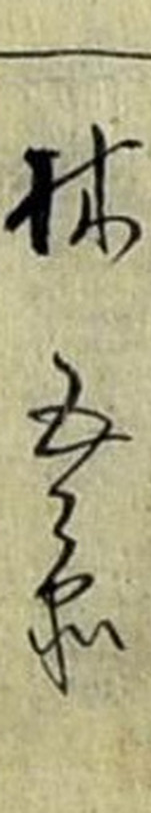林五兵衛
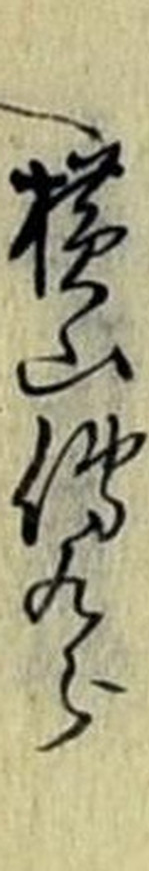横山伝九郎
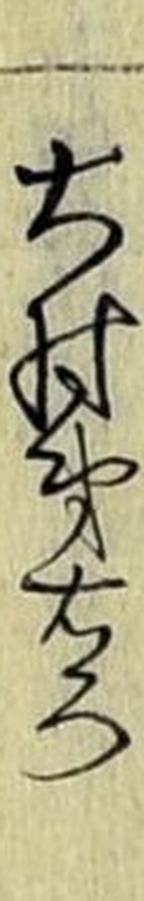大村第右衛門
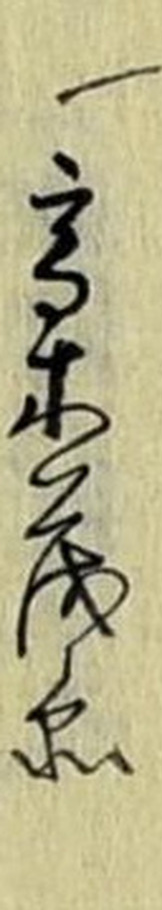高木茂兵衛
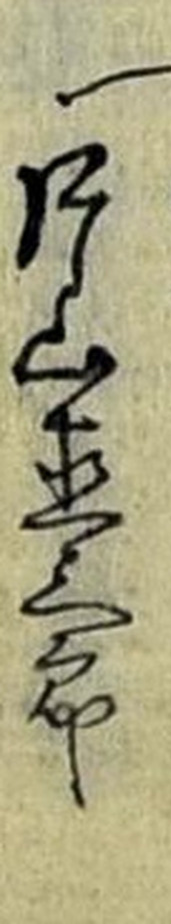片山直三郎
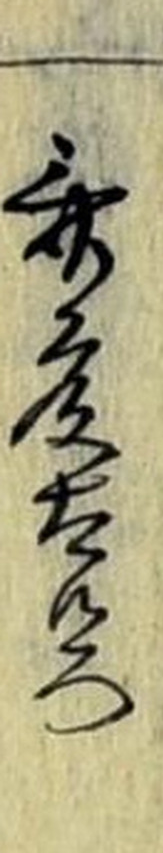斉藤太郎左衛門
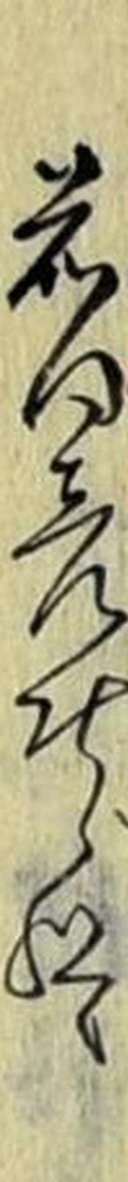前田彦次郎組へ
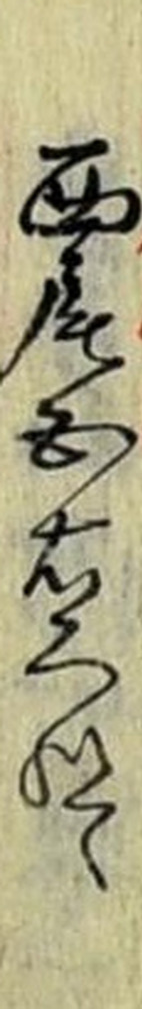西尾五右衛門組へ
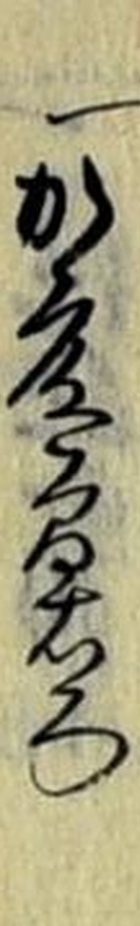加藤曽右衛門
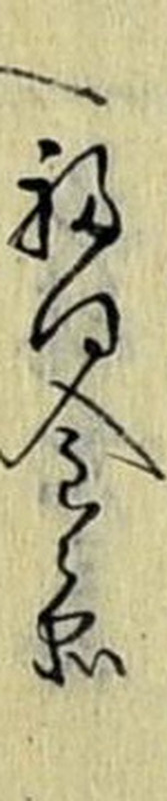福田金兵衛
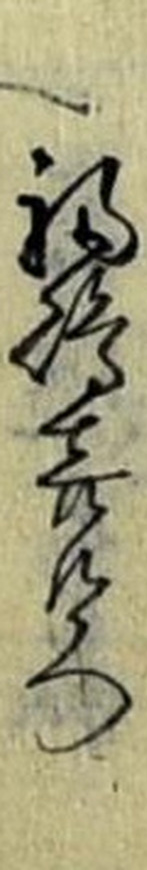福嶋喜左衛門
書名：命令之部 四
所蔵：福井県文書館 Fukui Prefectural Archives
